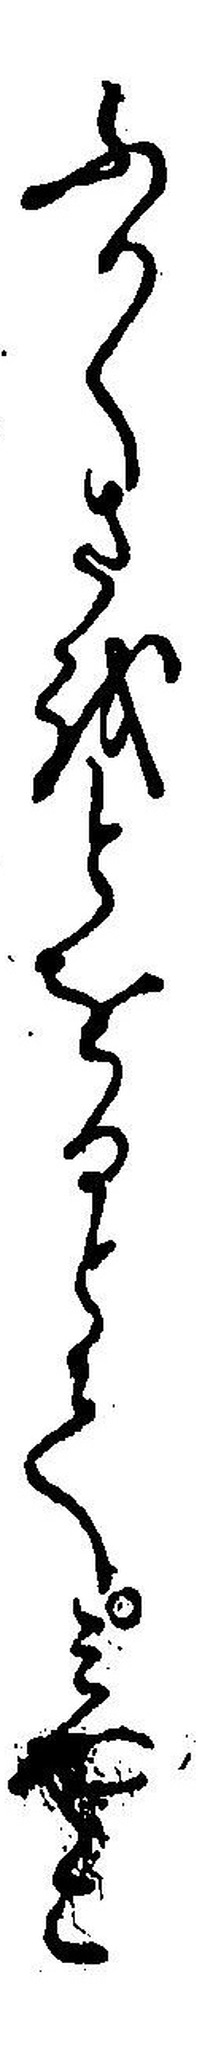ふかくさをとをるとて。みやこ
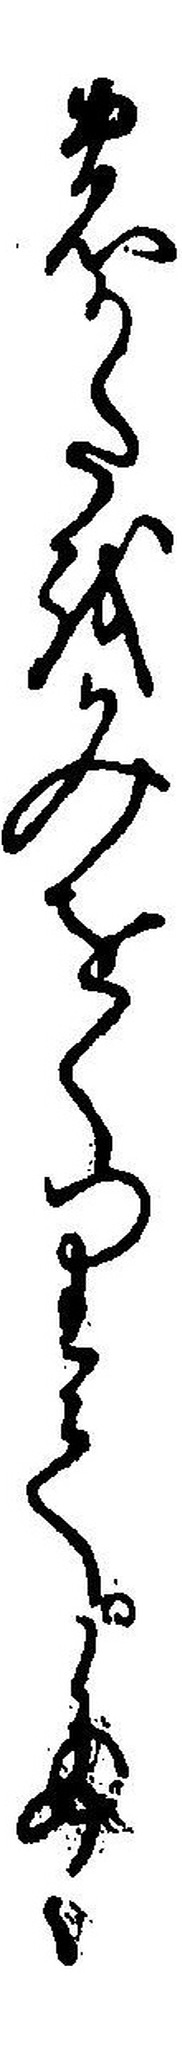のかたをみをくりて。たゝ
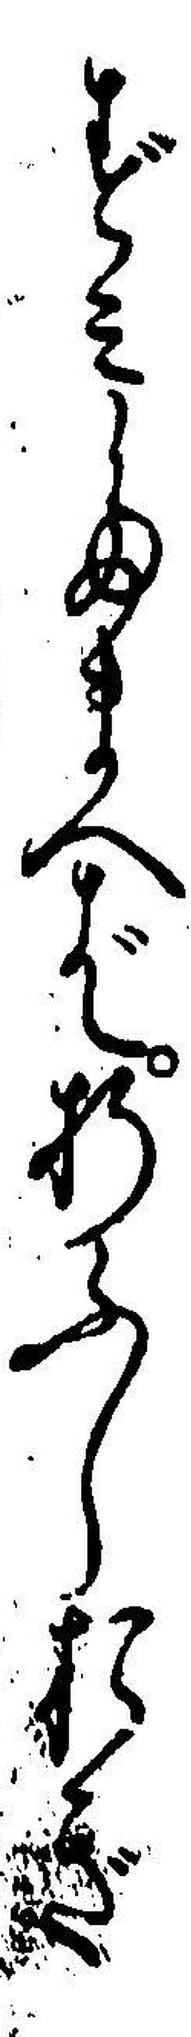ずみたまへば。折ふしおぎ
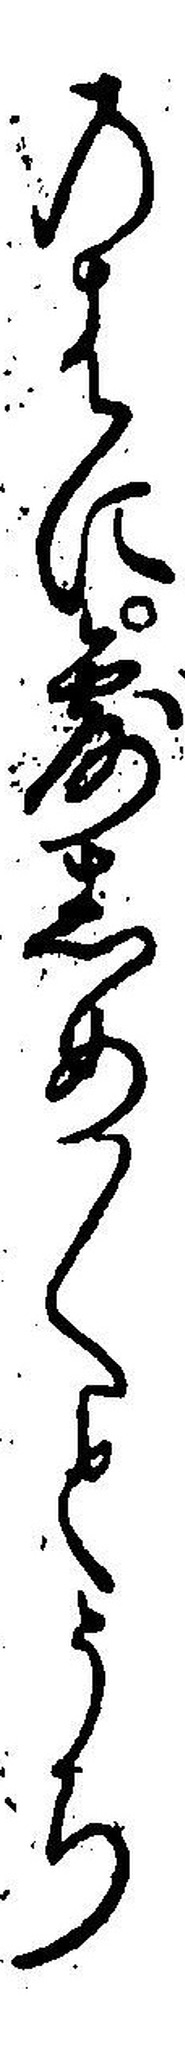のはに。露しめ〳〵とうち
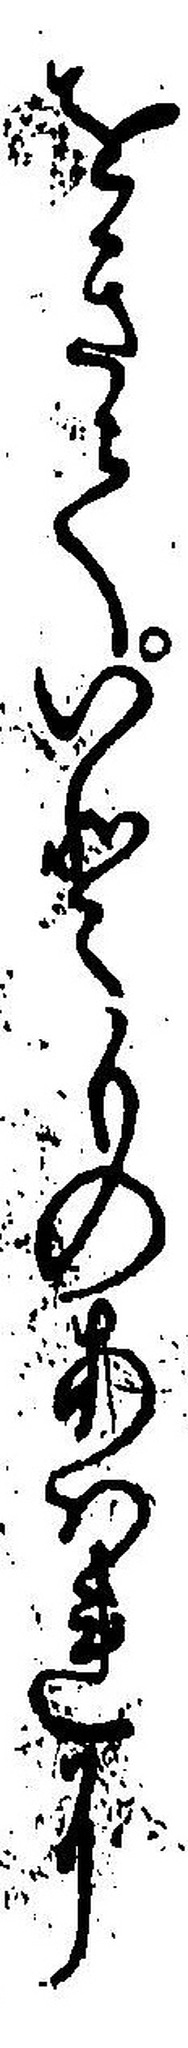をきて。いとものあはれに
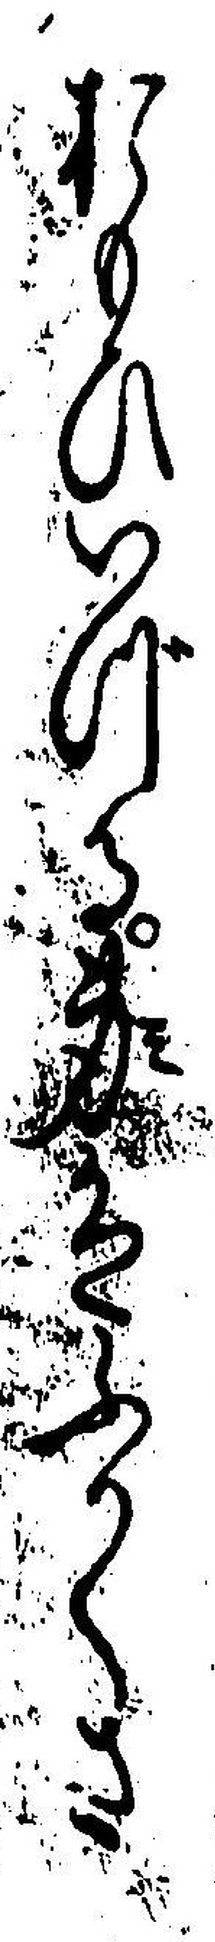おもひいづる。身はふかくさ

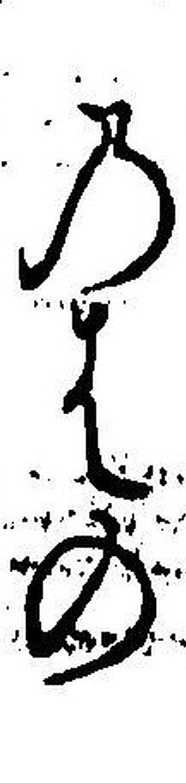のはの
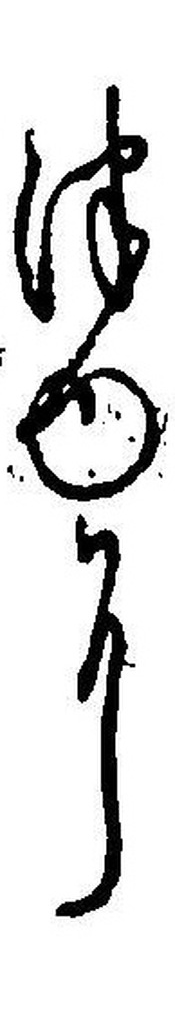つゆに
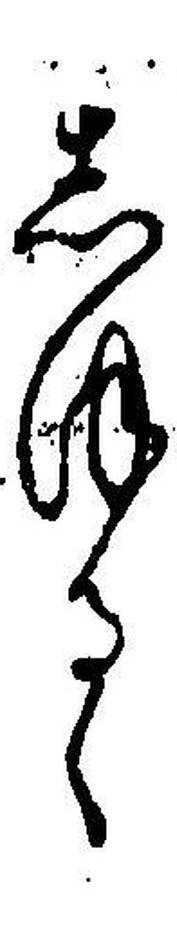しほるゝ

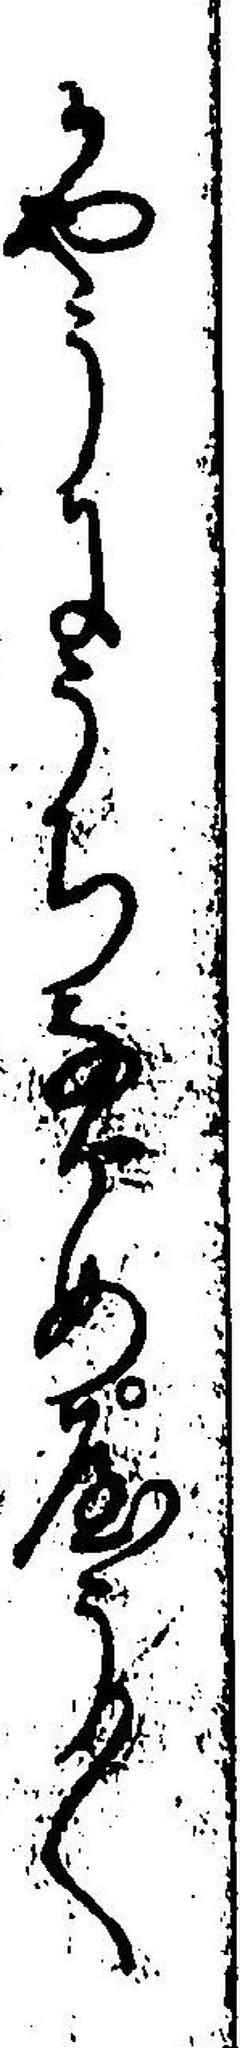かやうにうちながめ。やう〳〵
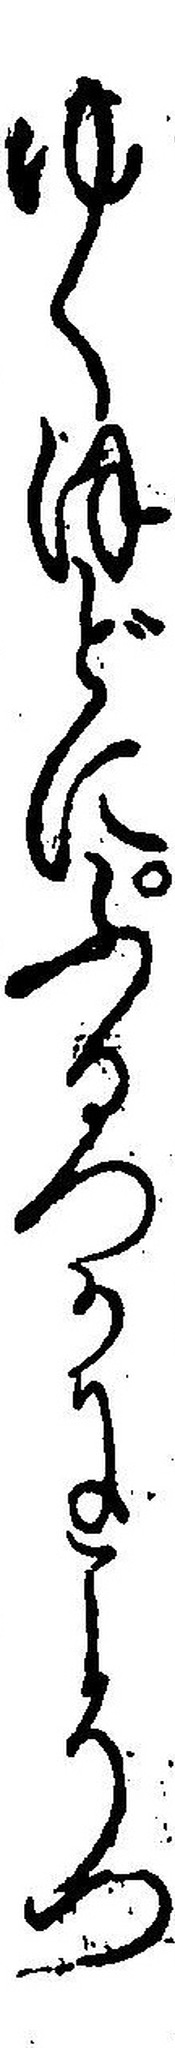ゆくほどに。ふるつかにこそつ
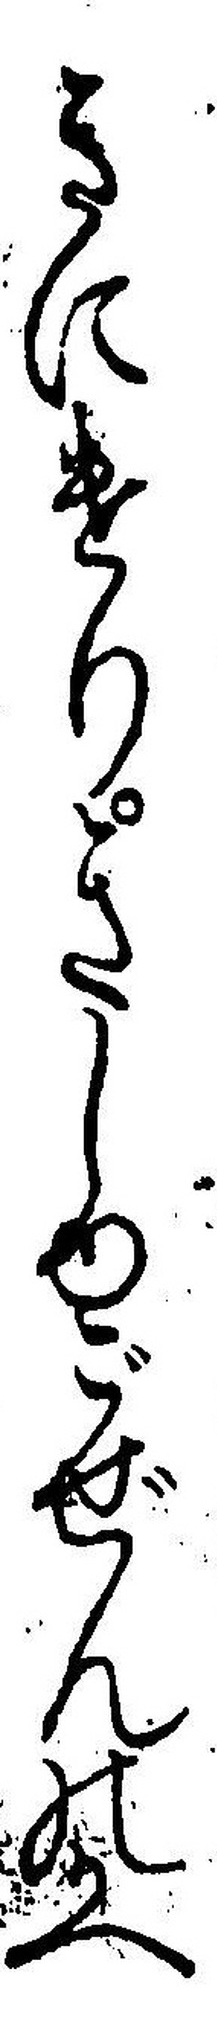きにけり。きしゆごぜんのかへ
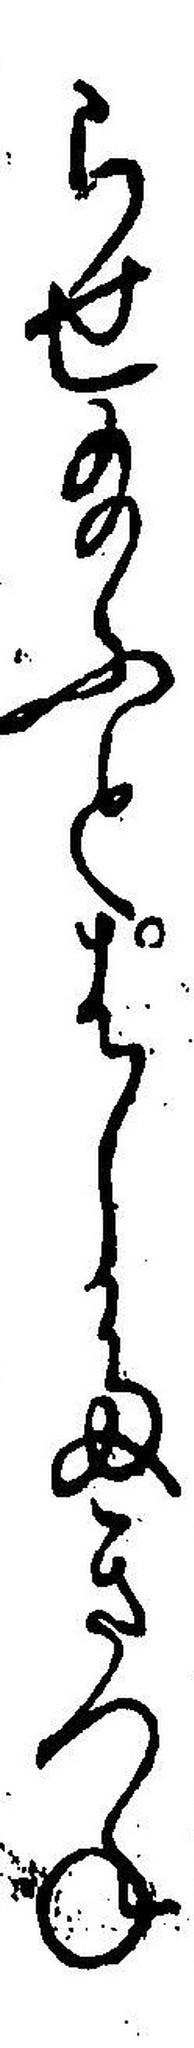らせ給ふと。はしたきつね
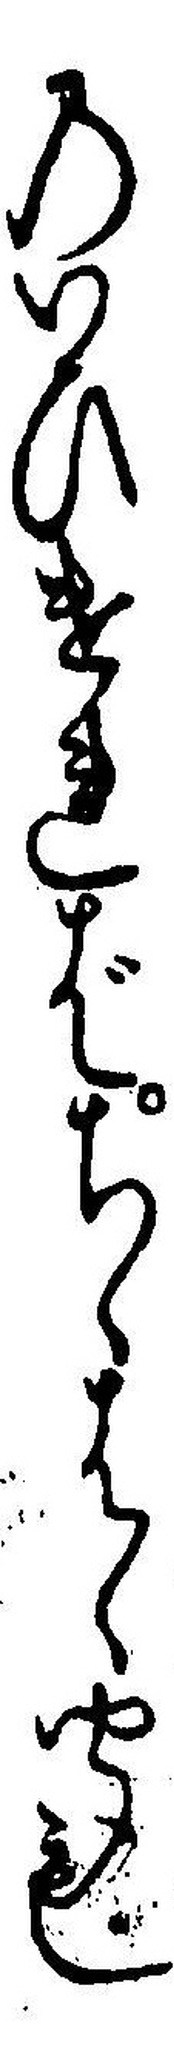のいひければ。ちゝはゝ聞も
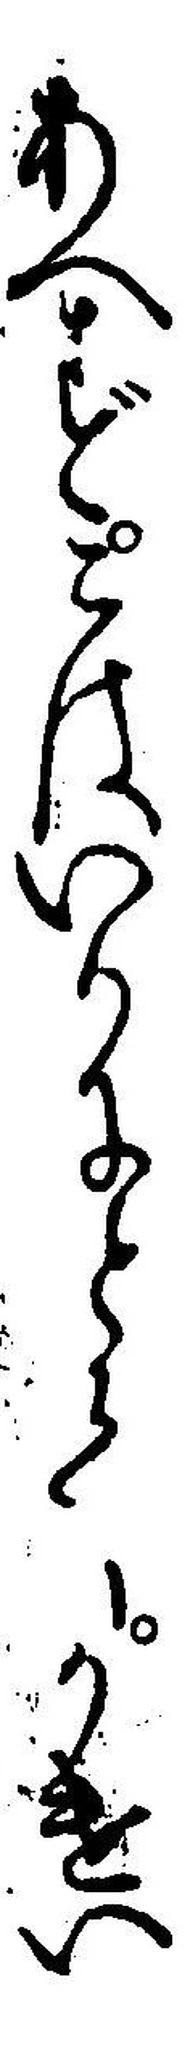あへず。こはいかにとて。かけい
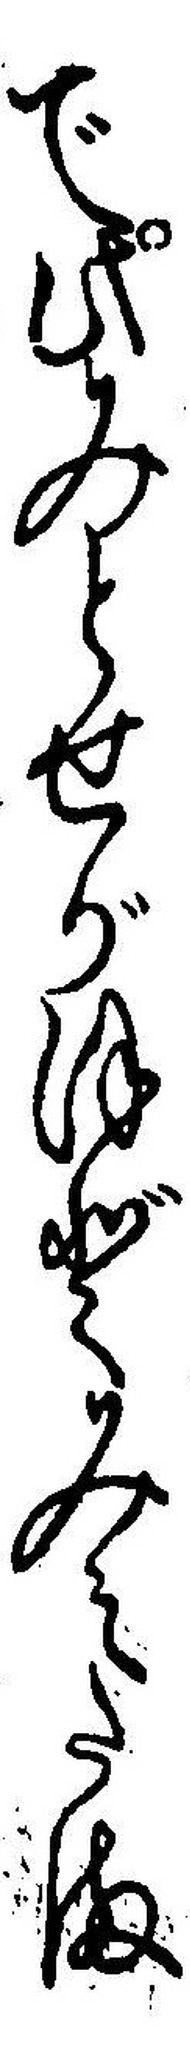で。此みとせがほどみえたま
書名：木幡きつね
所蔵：東京大学総合図書館 General Library in the University of Tokyo, JAPAN
